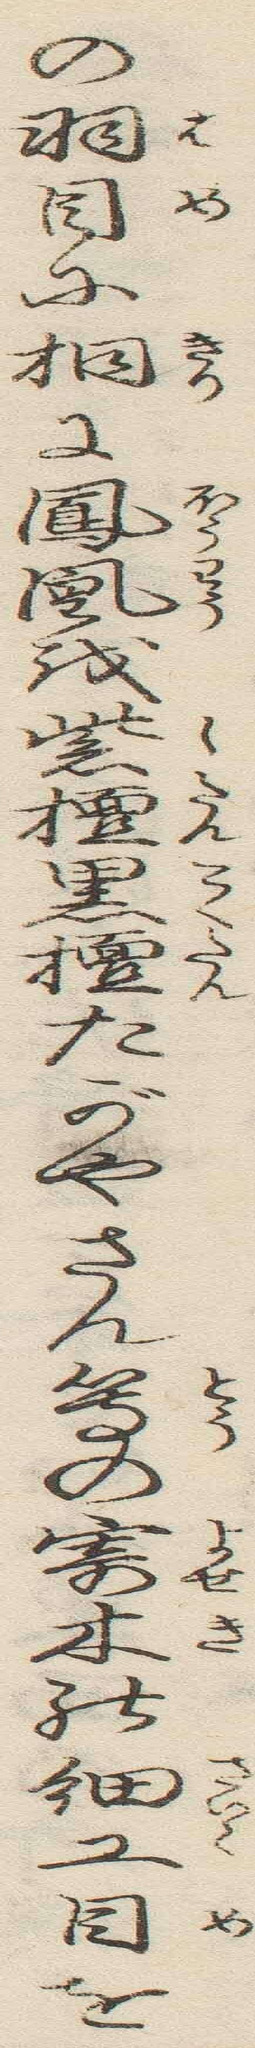の羽目に桐に鳳凰を紫檀黒檀たがやさん等の寄木の細工目を
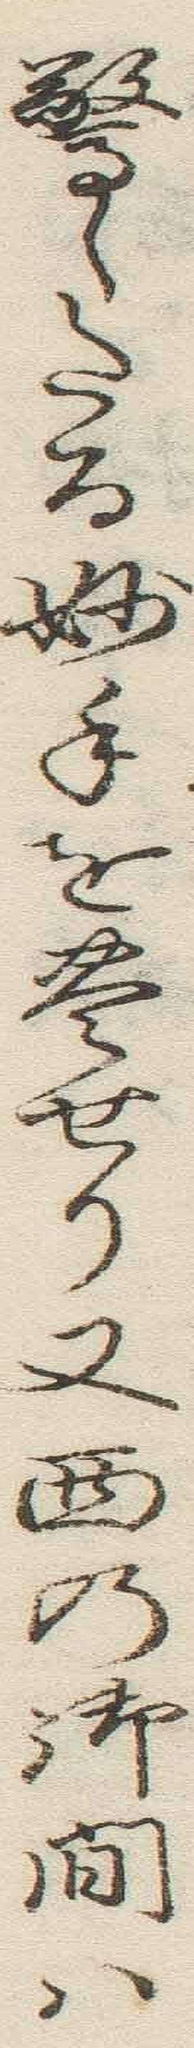驚したる妙手を尽せり又西の御間は
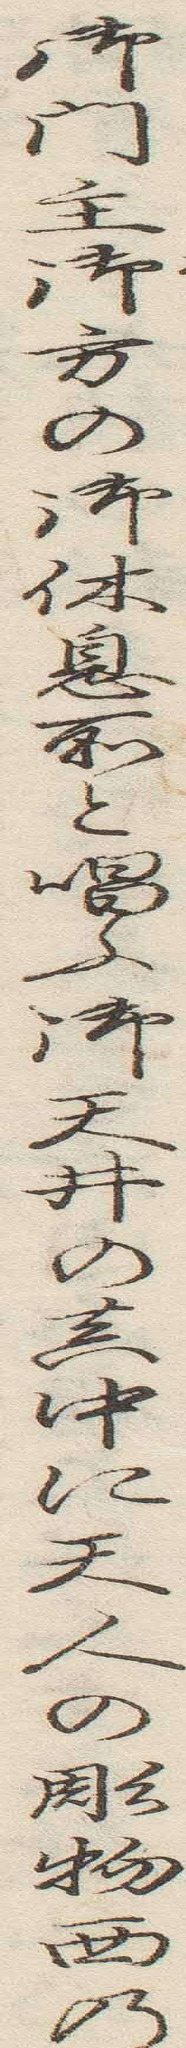御門主御方の御休息所と唱ふ御天井の真中に天人の彫物西の
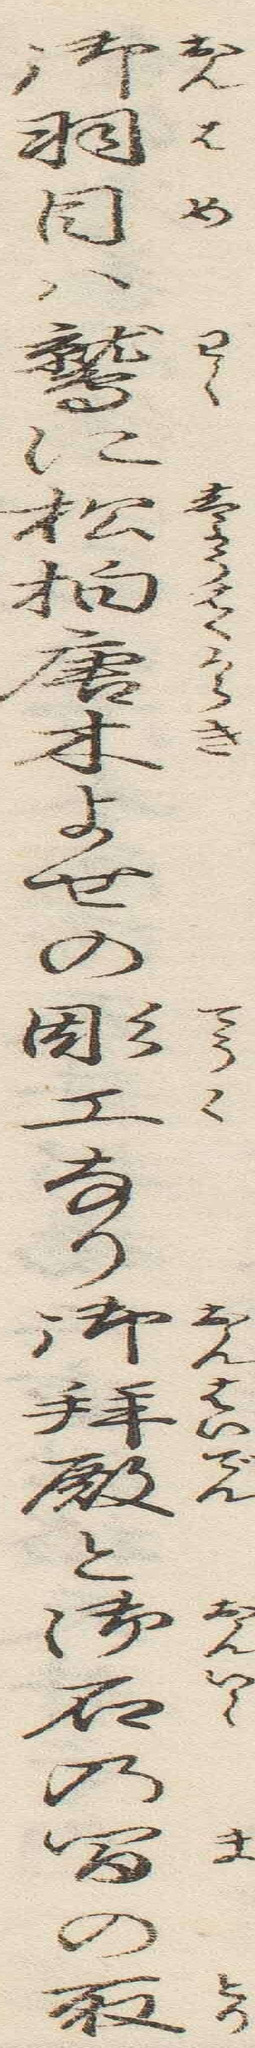御羽目は鷲に松柏唐木よせの彫工なり御拜殿と御石の間の取
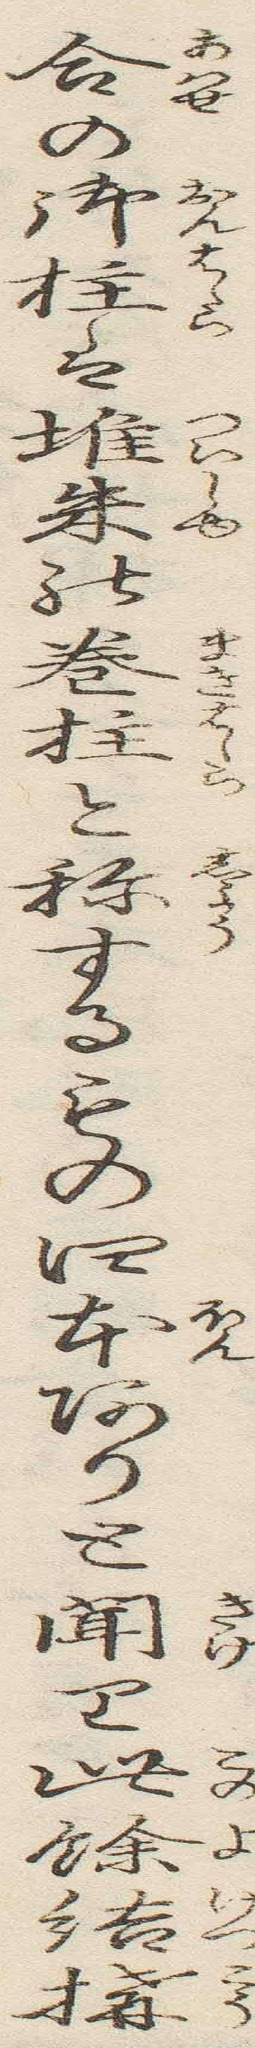合の御柱は堆朱の巻柱と称するもの四本ありと聞り此餘結搆
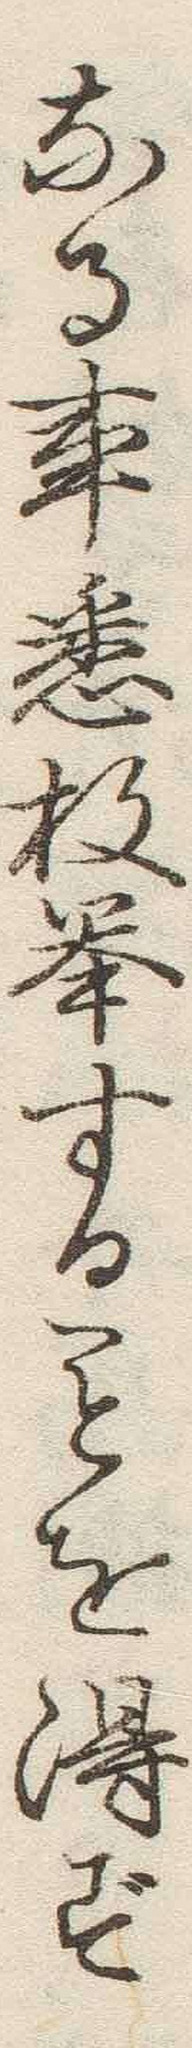なる事悉枚挙することを得ず
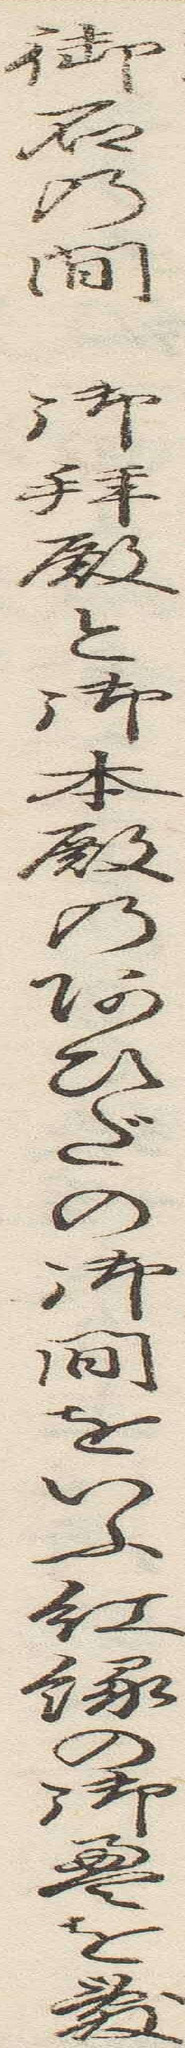御石の間御拜殿と御本殿のあひだの御間をいふ紅縁の御畳を敷
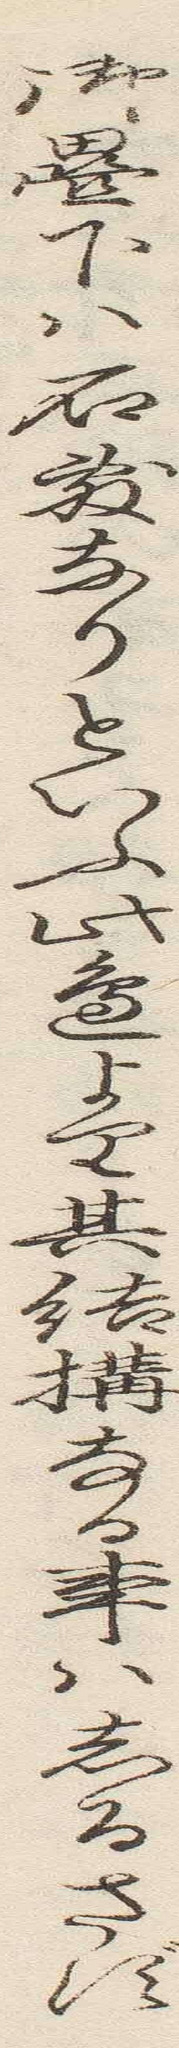御疂下は石敷なりといふ此邊より其結搆なる事はしるさず
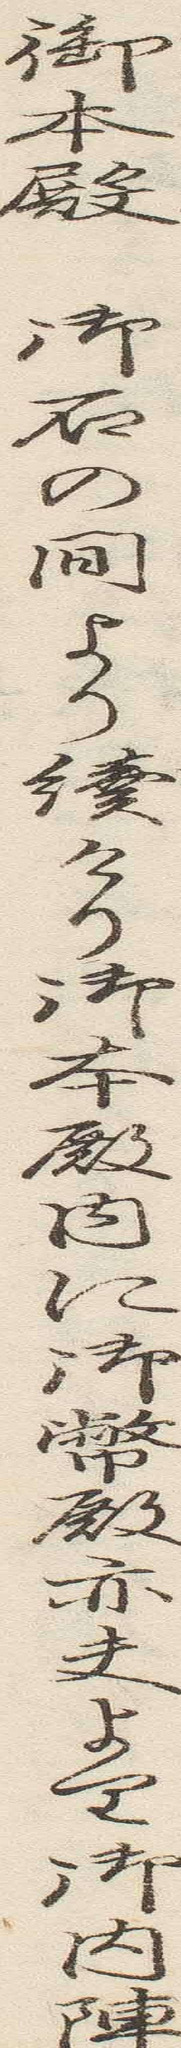御本殿御石の間より續けり御本殿内に御幣殿亦夫より御内陣
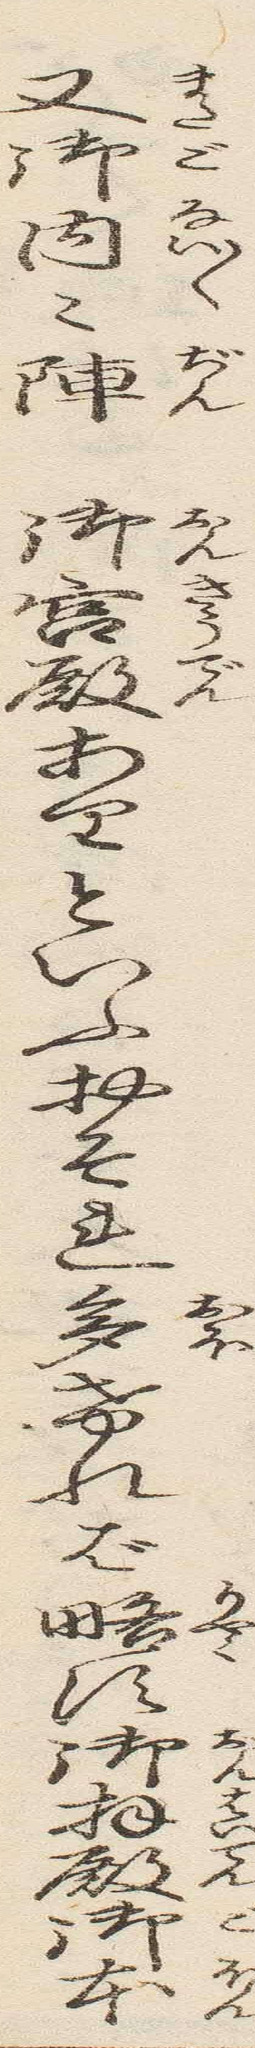又御内〻陣御宮殿ありといふおそれ多ければ略す御拝殿御本
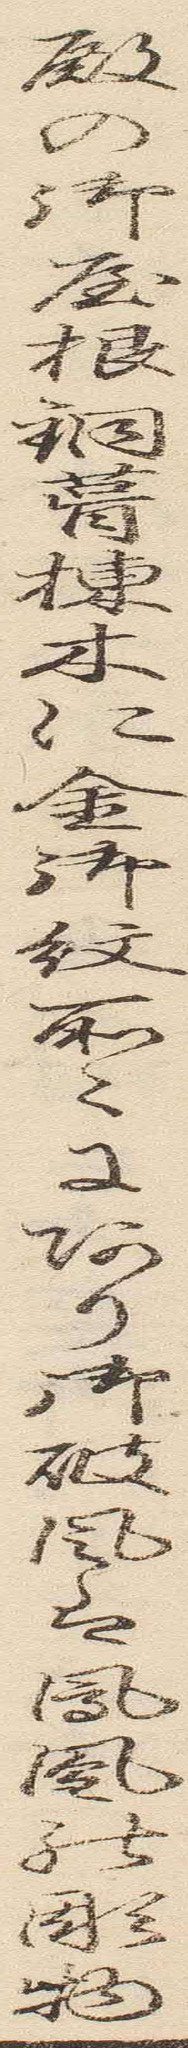殿の御屋根銅葺棟木に金御紋所〻にあり御破風は鳳凰の彫物
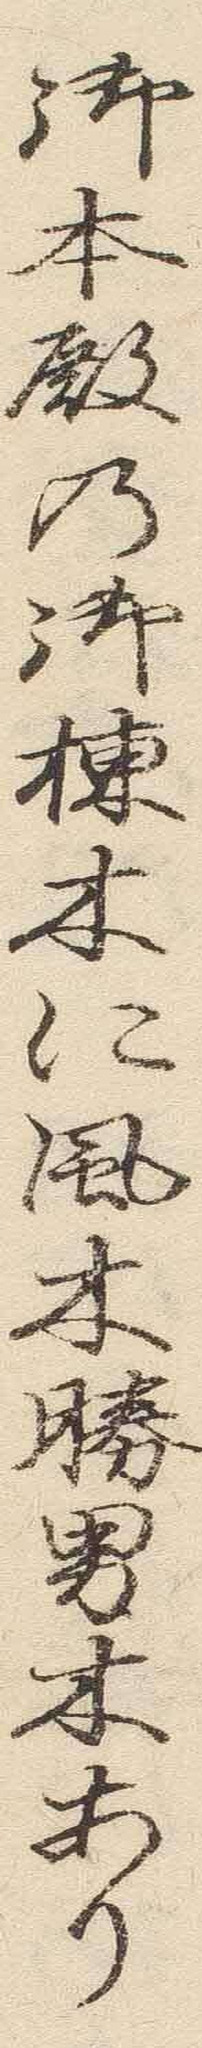御本殿の御棟木に風木勝男木あり
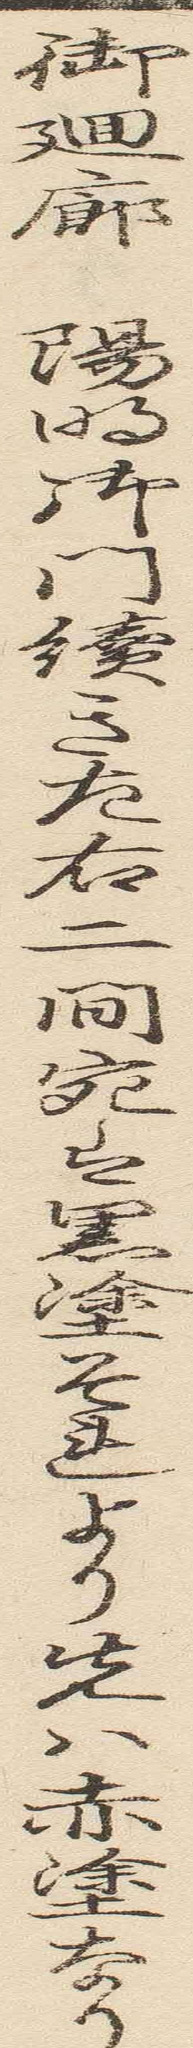御廽廊陽明御門續き左右二間宛は黒塗それより先は赤塗なり
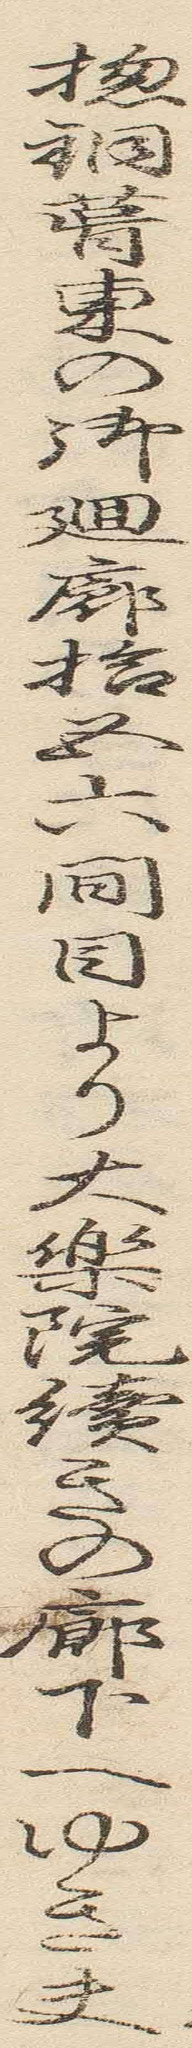揔銅葺東の御廽廊拾五六間目より大樂院續きの廊下へゆき夫
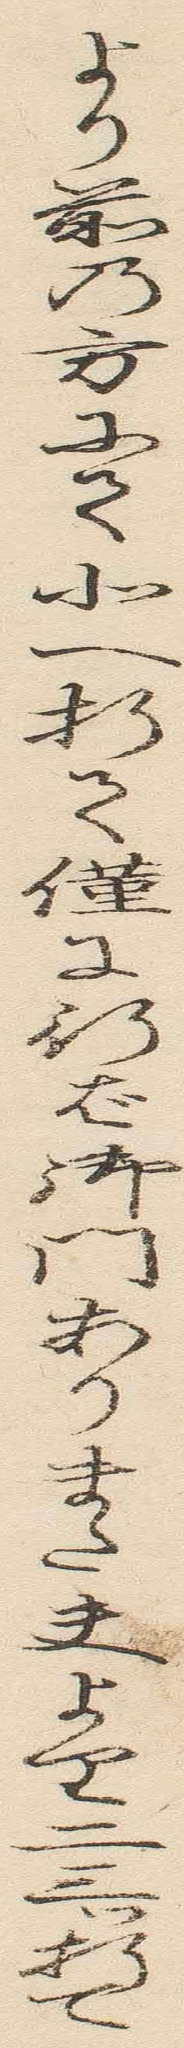より前の方にて北へ折て僅に行ば御門ありまた夫より二三ッ折て
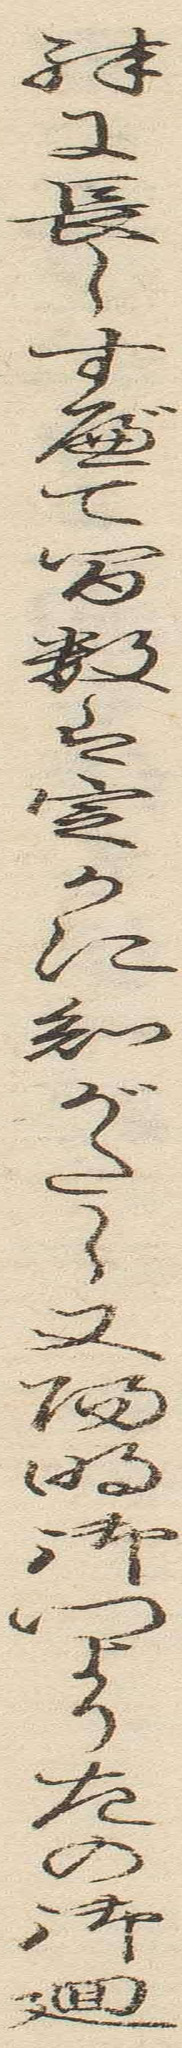殊に長しすべて間数は定かに知がたし又陽明御門より左の御廽
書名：日光山志
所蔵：東京学芸大学附属図書館 国文学研究資料館
